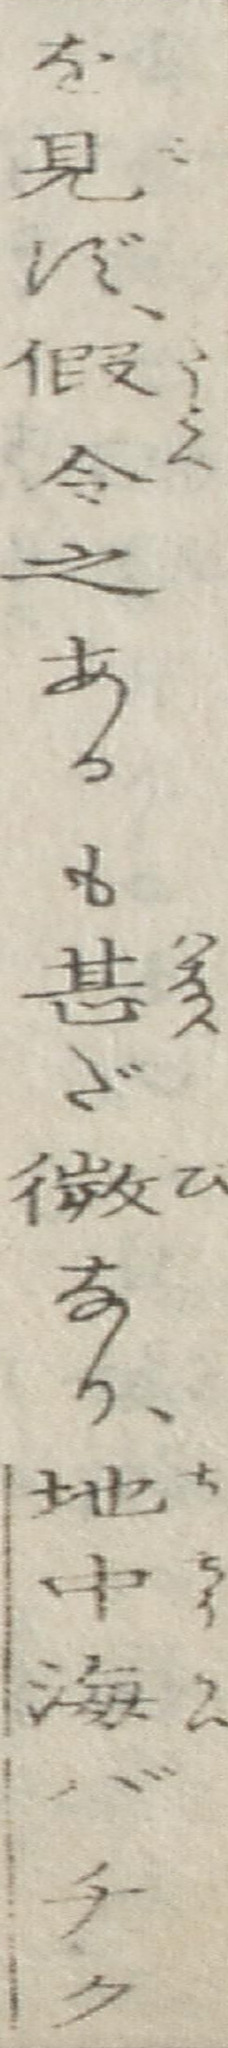を見ず、仮令之あるも甚だ微なり、地中海バチク
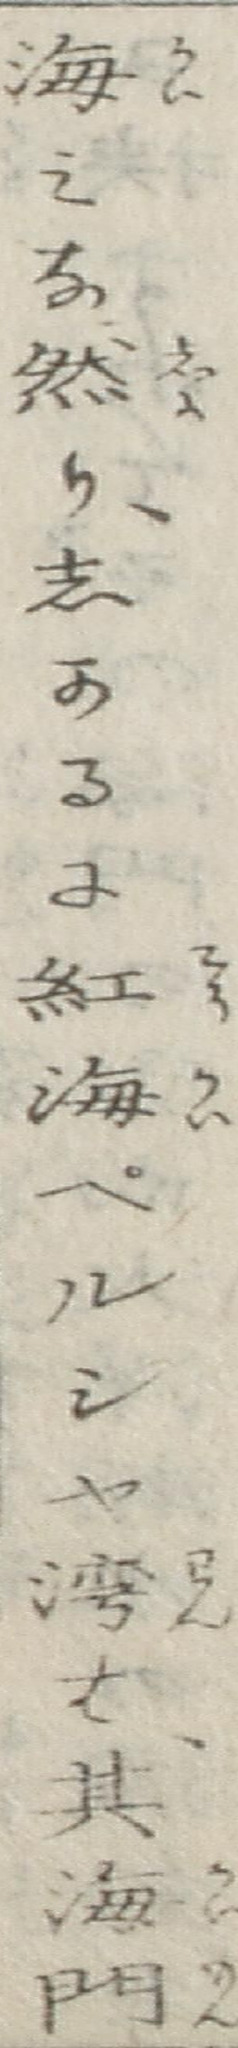海みな然り、しかるに紅海ペルシヤ湾は、其海門
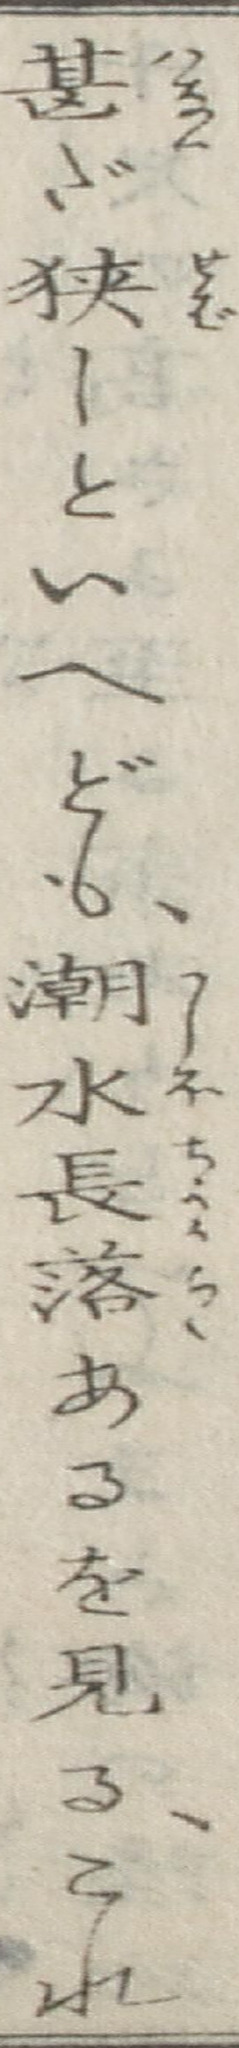甚だ狭しといへども、潮水長落あるを見る、これ
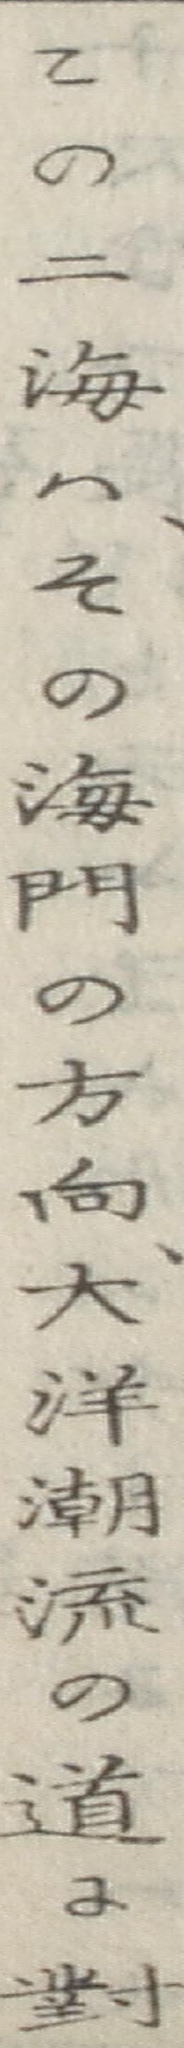この二海は、その海門の方向、大洋潮流の道に対
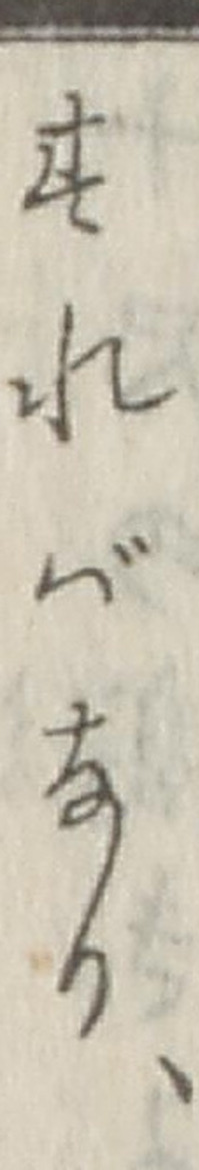すればなり、
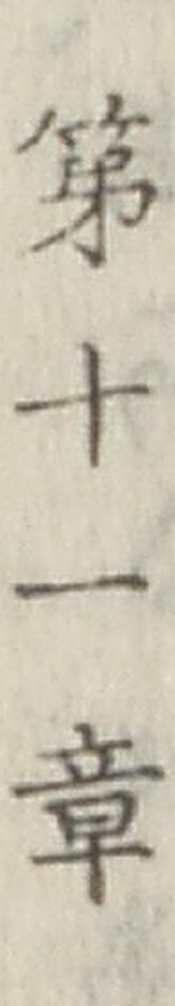第十一章
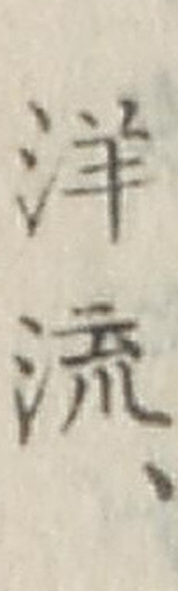洋流、
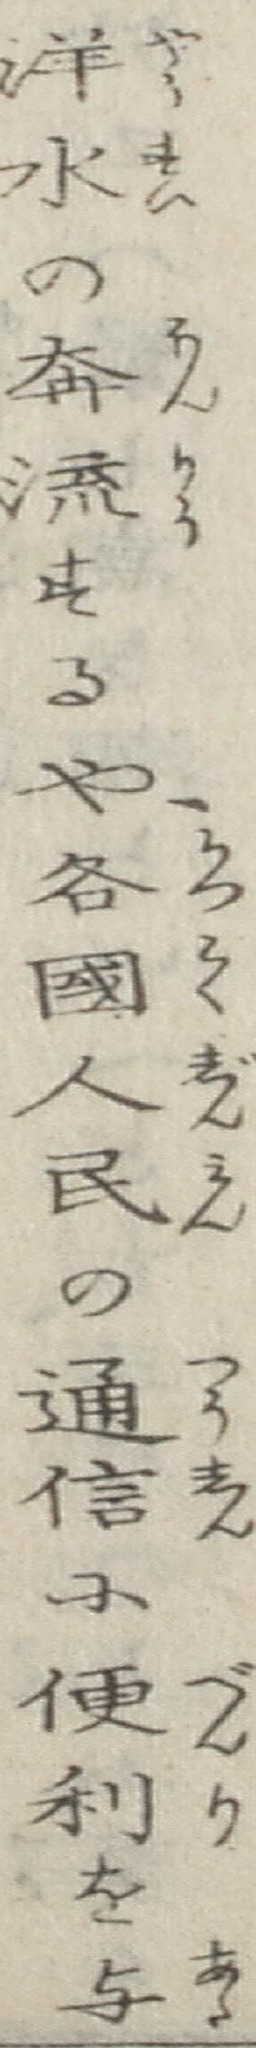洋水の奔流するや、各国人民の通信に便利を与
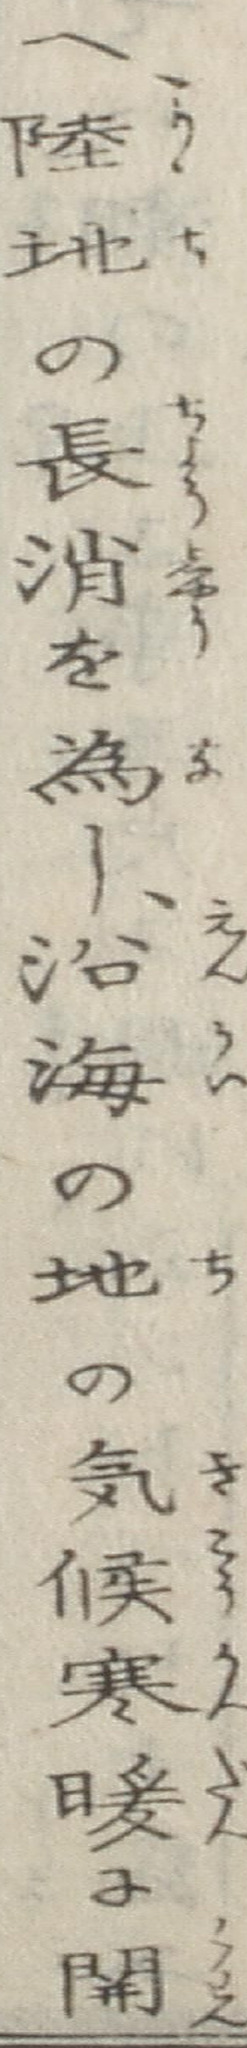へ、陸地の長消を為し、沿海の地の気候寒暖に関
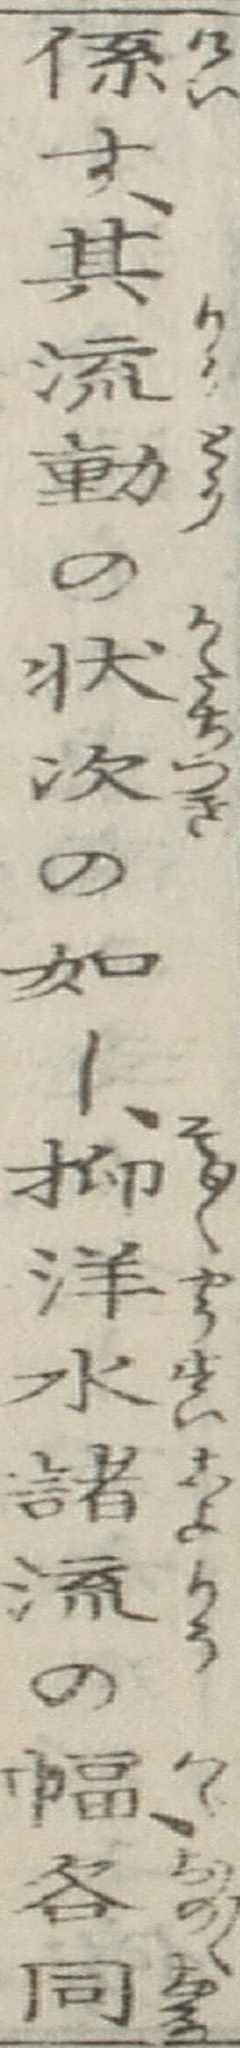係す、其流動の状次の如し、抑洋水諸流の幅、各同
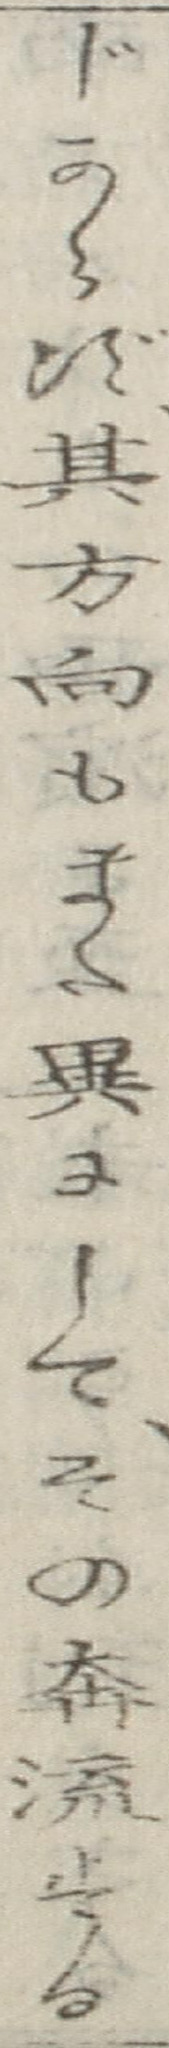じからず、其方向もまた異にして、その奔流する
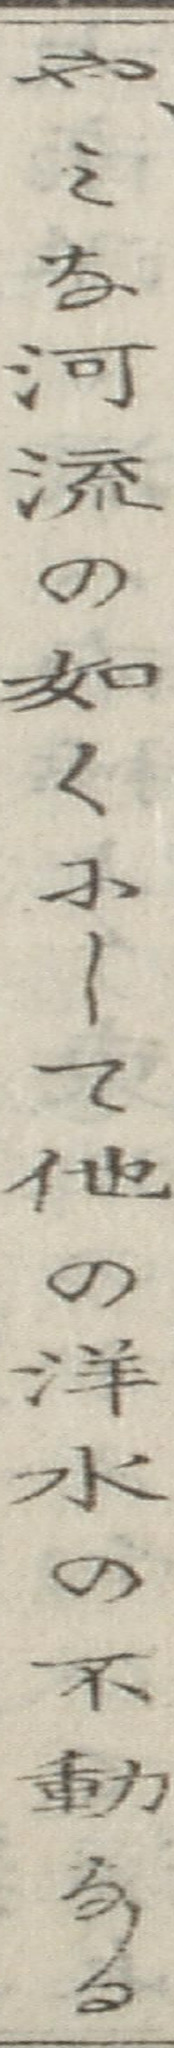や、みな河流の如くにして、他の洋水の不動なる
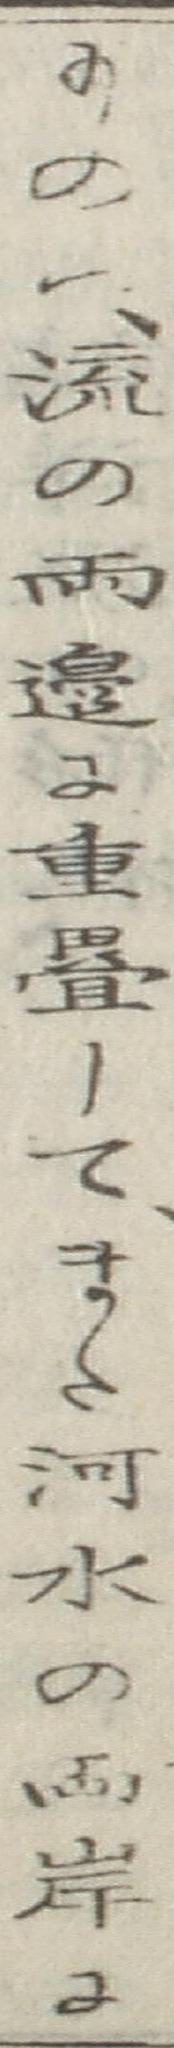ものへ、流の両辺に重畳して、また河水の両岸に
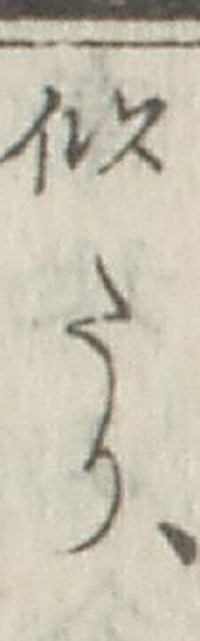似たり、
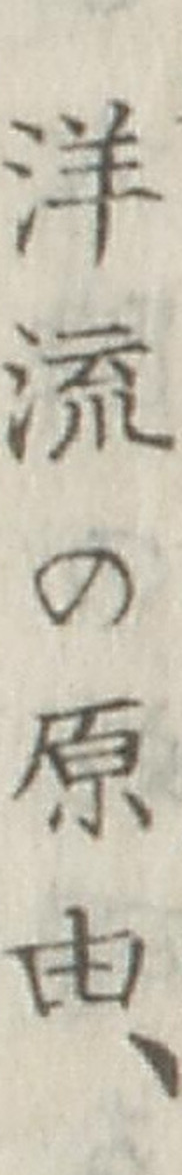洋流の原由、
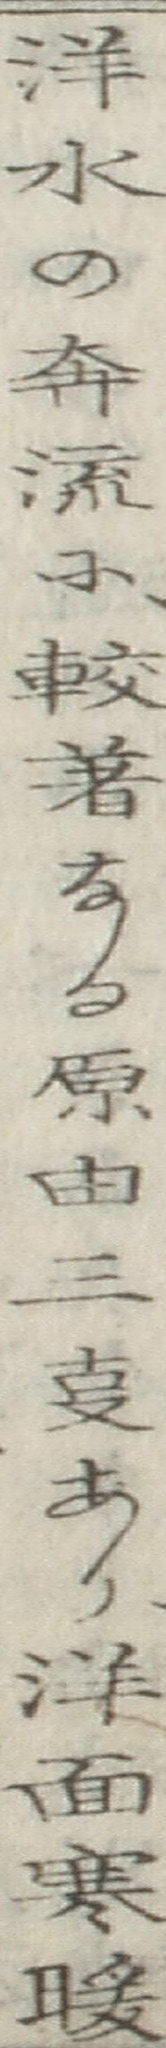洋水の奔流に、較著なる原由三事あり、洋面寒暖
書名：訓蒙　天然地理學　中
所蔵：東京大学地震研究所図書室 Earthquake Research Institute Library, The University of Tokyo, JAPAN
